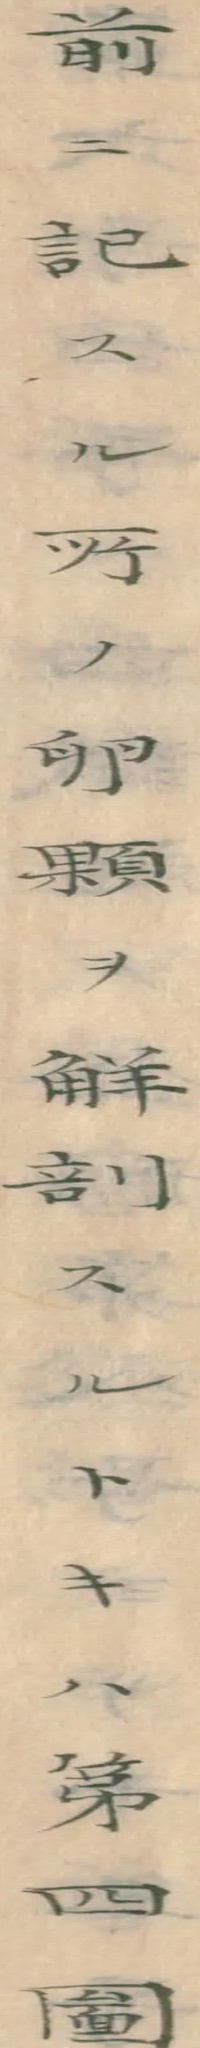前ニ記スル所ノ卵顆ノ解剖スルトキハ第四図
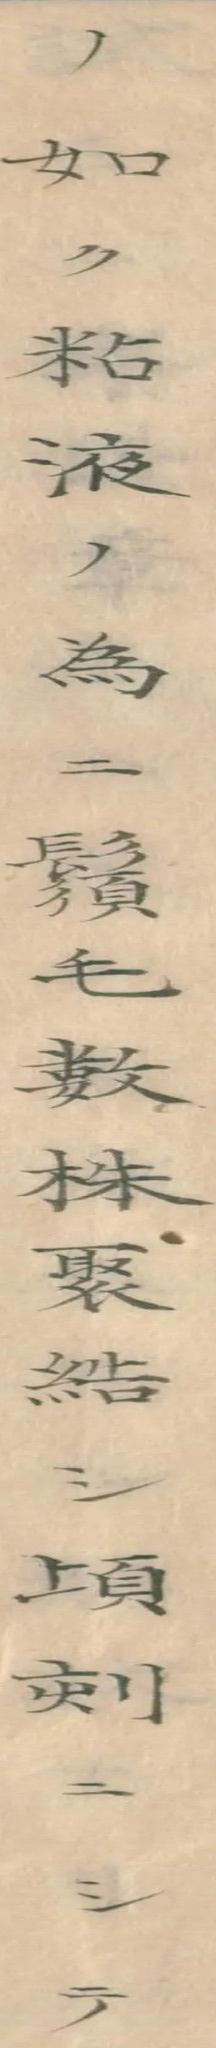ノ如ク粘液ノ為ニ鬚毛数株聚結シ頃刻ニシテ
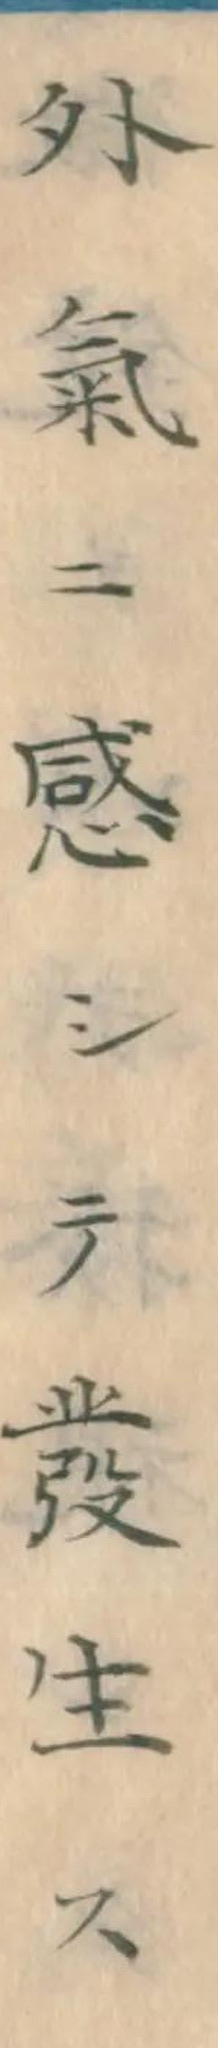外気ニ感シテ発生ス

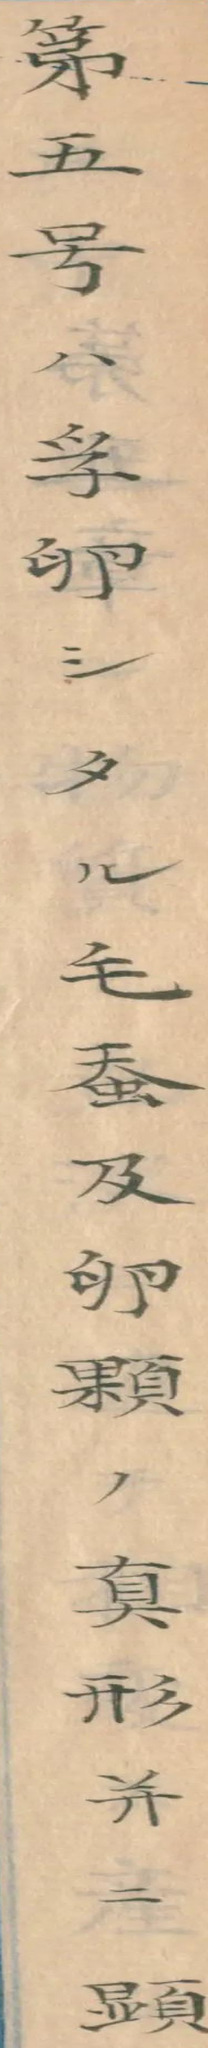第五号ハ孚卵シタル毛蚕及卵顆ノ真形并ニ顕
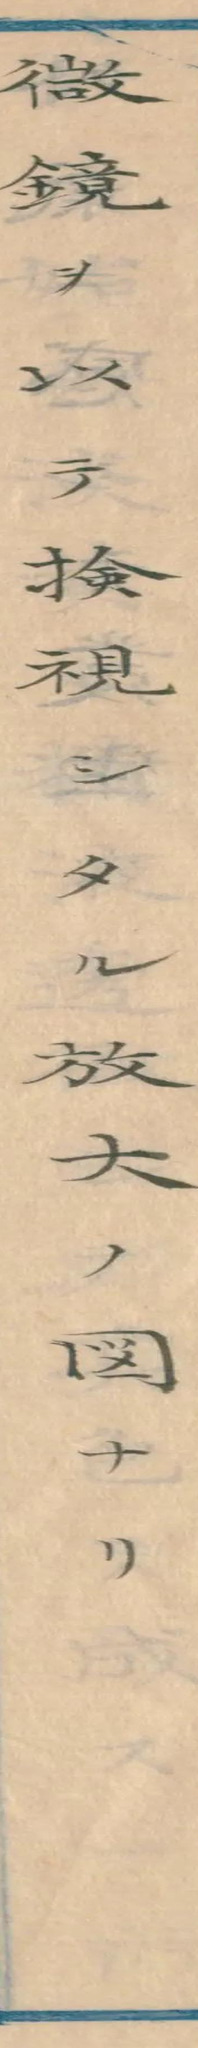微鏡ヲ以テ検視シタル放大ノ図ナリ
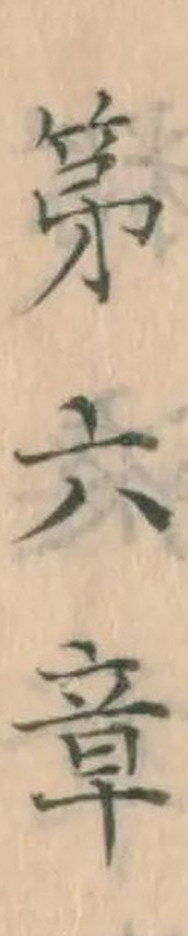第六章
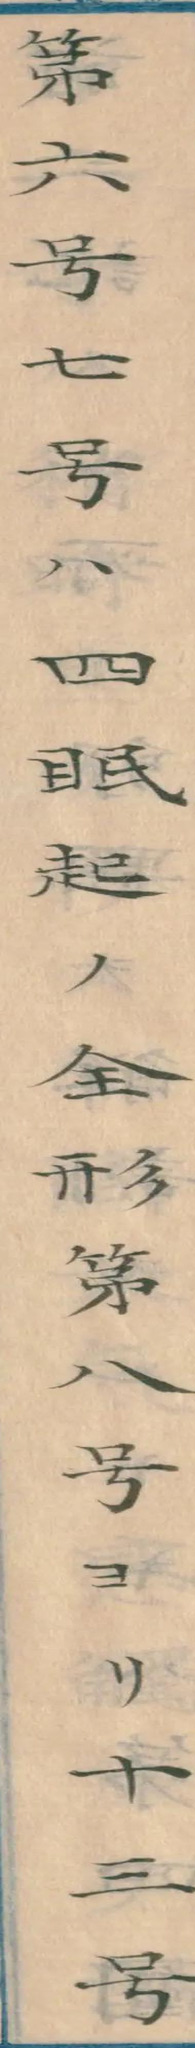第六号七号は四眠起ノ全形第八号ヨリ十三号
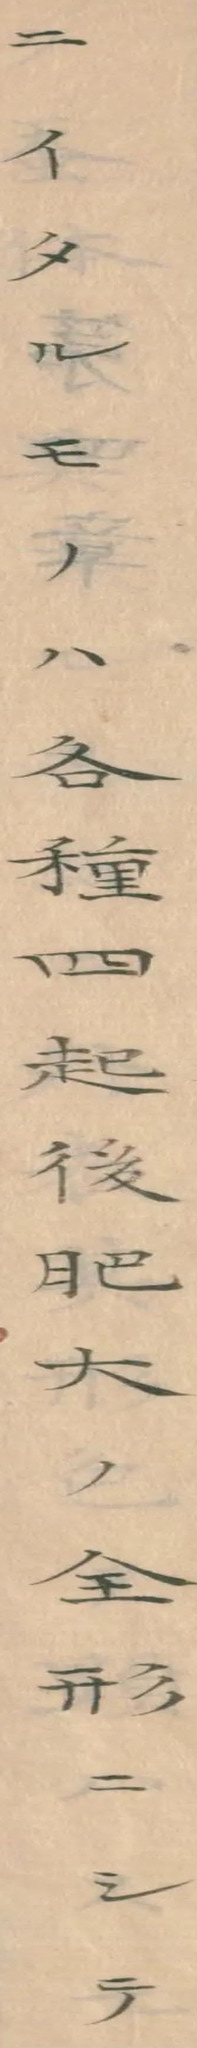ニイタルモノハ各種四起後肥大ノ全形ニシテ
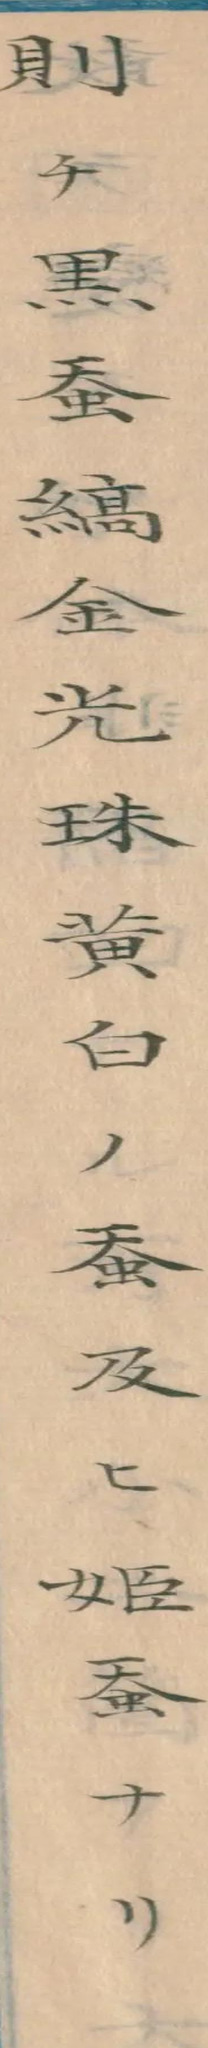則チ黒蚕縞金光珠黄白ノ蚕及ヒ姫蚕ナリ
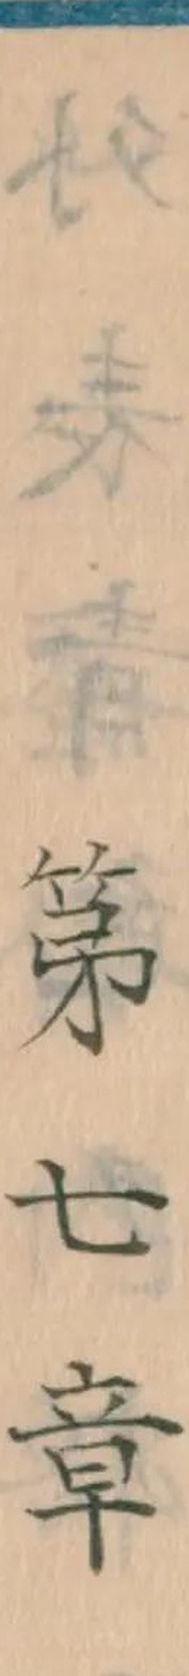第七章
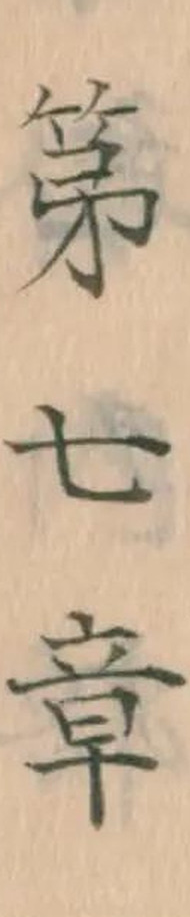第七章
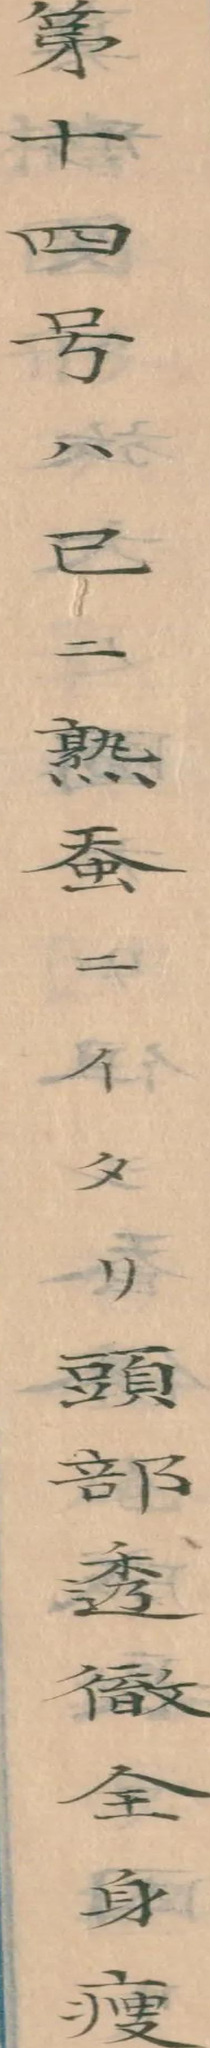第十四号ハ已ニ熟蚕ニイタリ頭部透徹全身痩
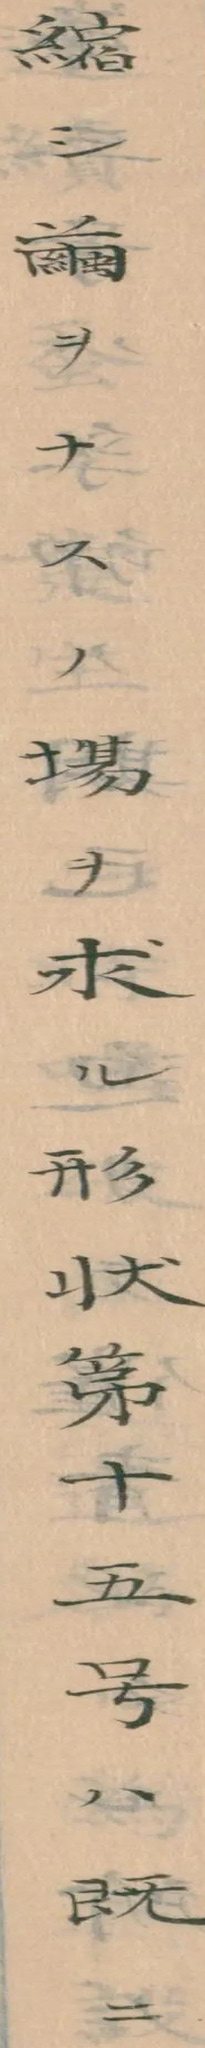縮シ繭ヲナスノ場ヲ求ル形状第十五号ハ既ニ
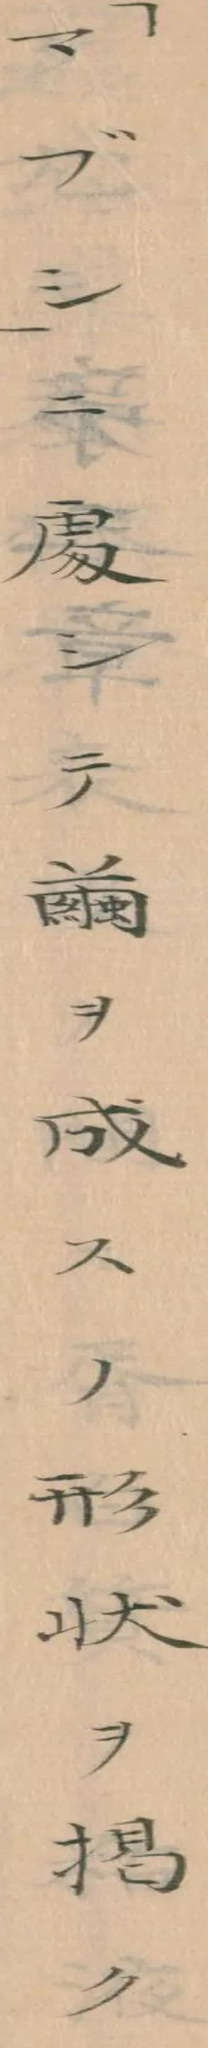「マブシ」ニ処シテ繭ヲ成スノ形状ヲ掲ク
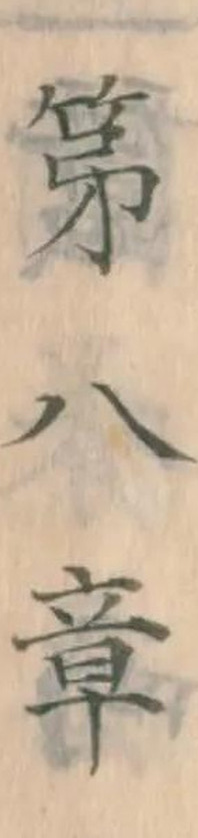第八章
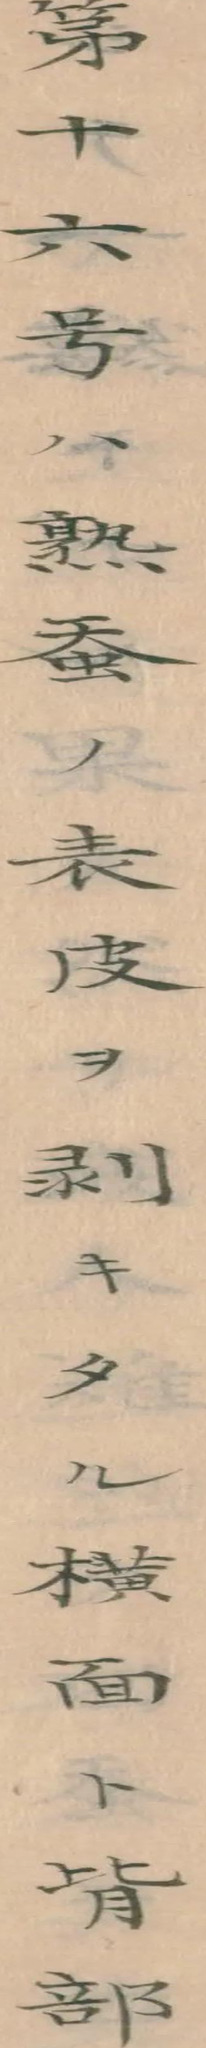第十六号ハ熟蚕ノ表皮ヲ剥キタル横面ト背部
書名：蚕桑集成
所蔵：国立国会図書館 National Diet Library, JAPAN
